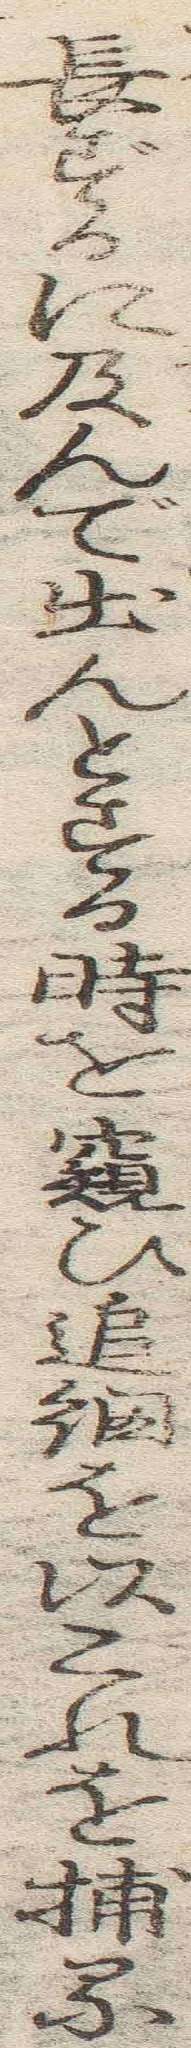長ずるに及んで出んとする時を窺ひ追網を以これを捕る
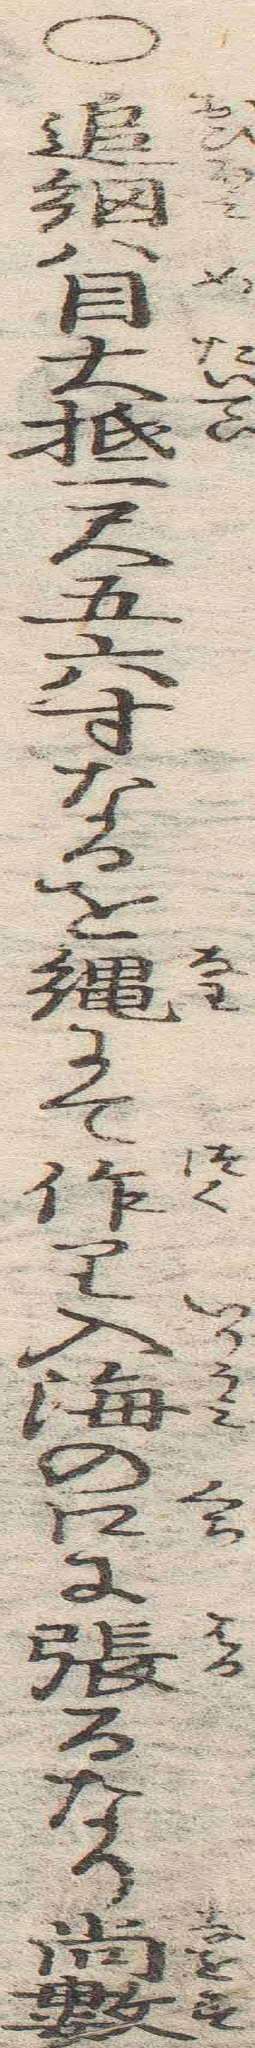○追網は目大抵一尺五六寸なるを縄にて作り入海の口に張るなり尚数
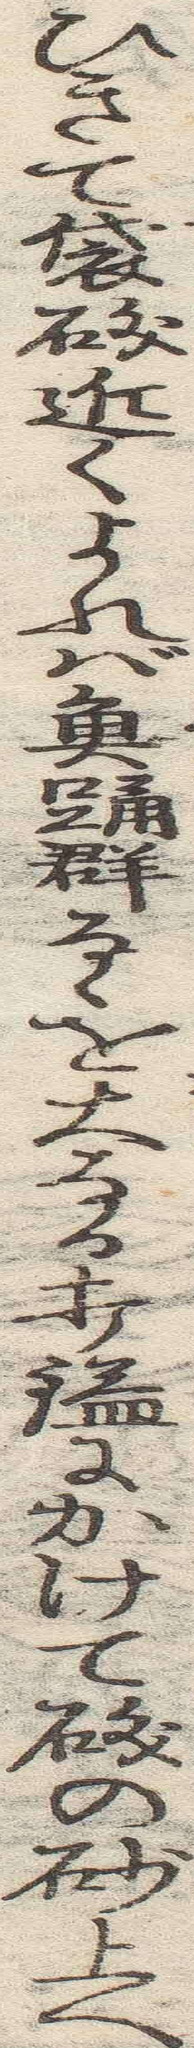ひきて袋礒近くよれば魚踊群るゝを大なる打鎰にかけて礒の砂上へ
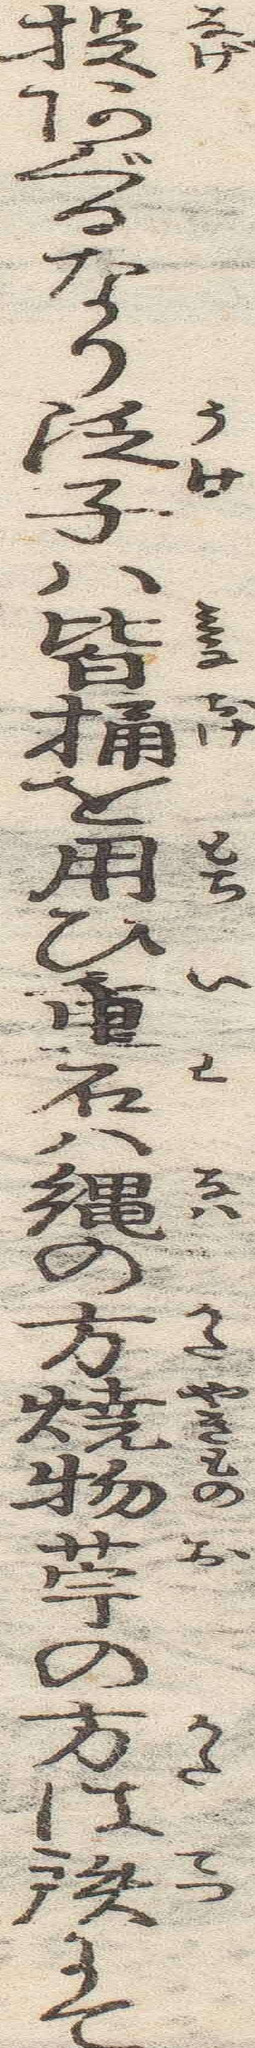投あぐるなり泛子は皆桶を用ひ重石は縄の方焼物荢の方は鉄にて
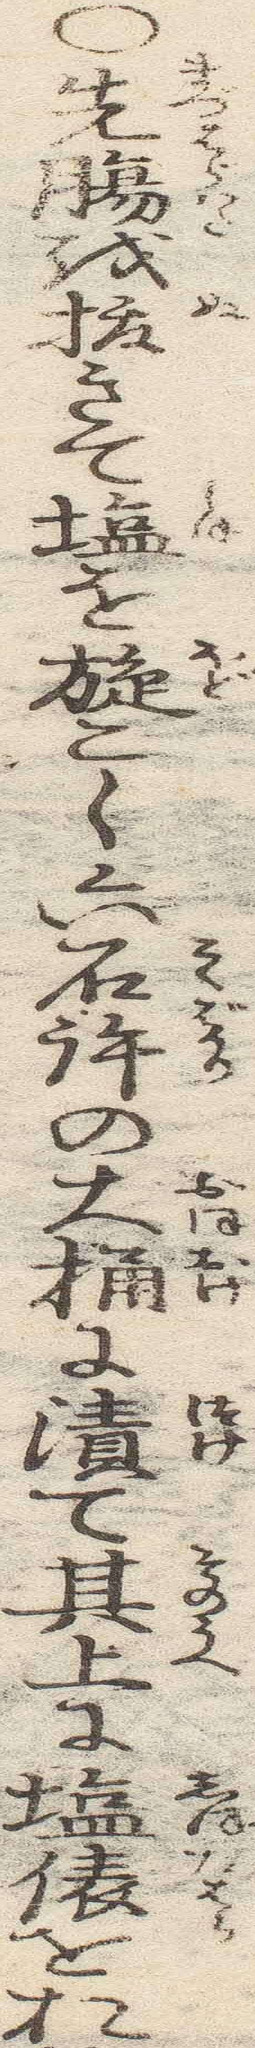○先膓を抜きて塩を施こし六石許の大桶に漬て其上に塩俵をお
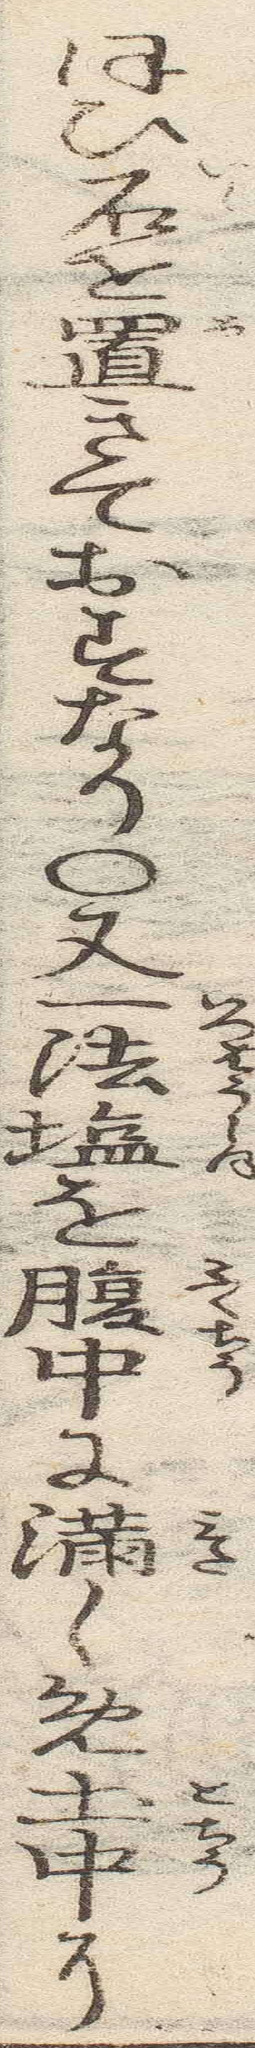ほひ石を置きておすなり○又一法塩を腹中に満しめ土中に
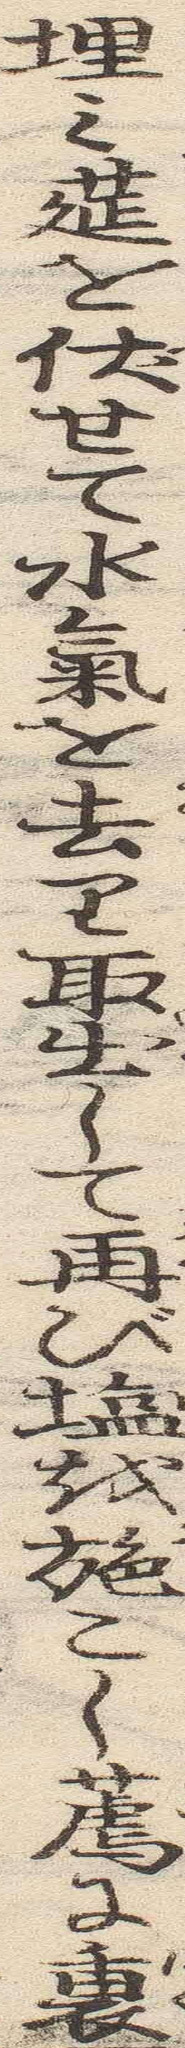埋み筵を伏せて水気を去り取出して再び塩を施こし薦に裹
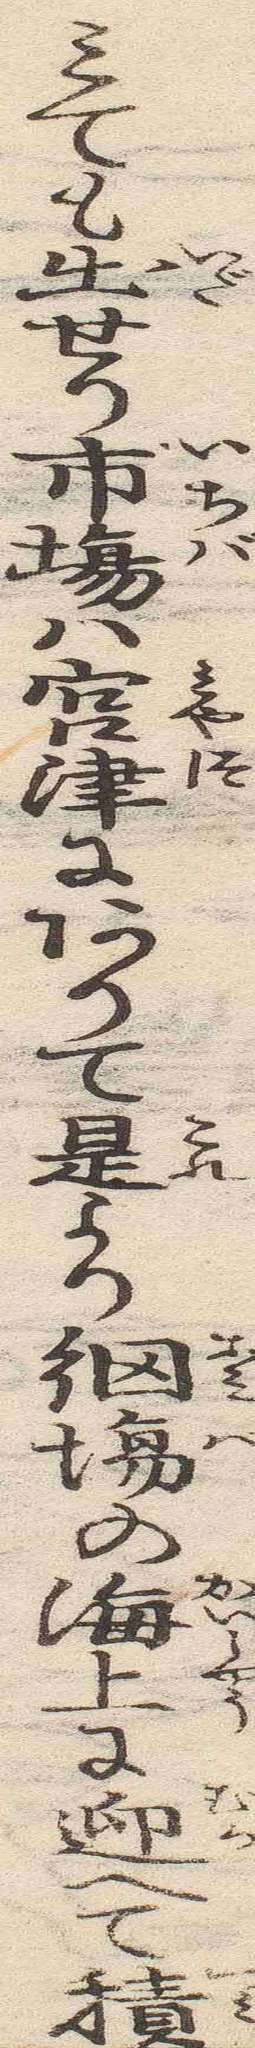みても出せり市場は宮津にありて是より網場の海上に迎へて積
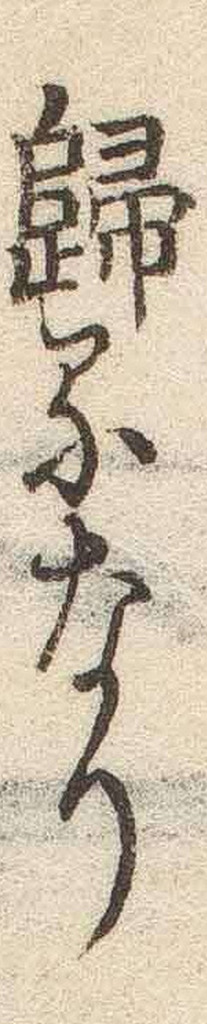帰るなり
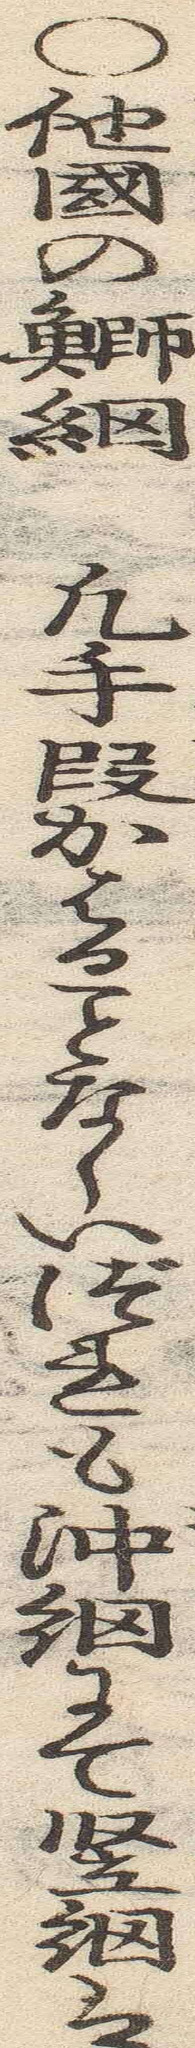○他国の鰤網凡手段かはることなしいづれも沖網にて竪網は
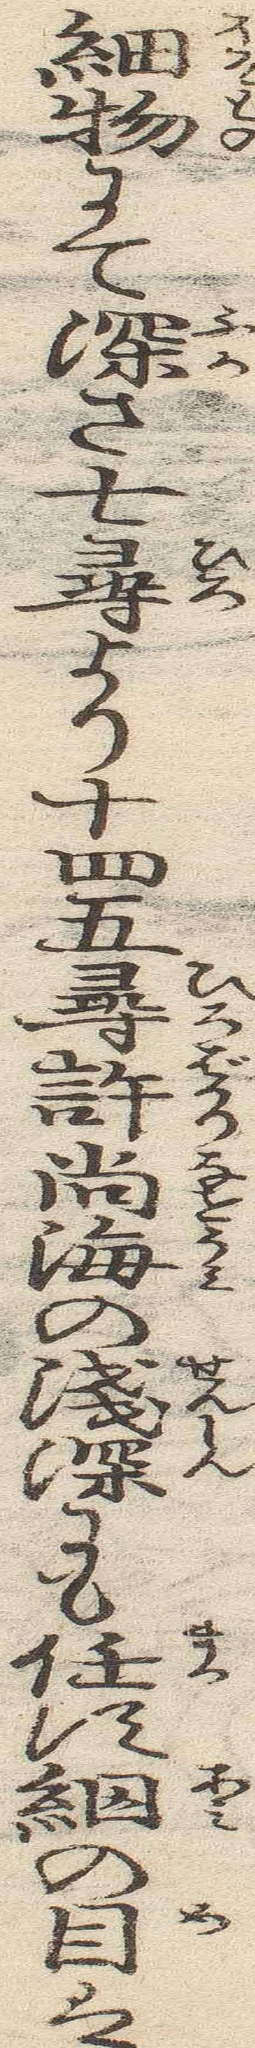細物にて深さ七尋より十四五尋許尚海の浅深にも任す網の目は
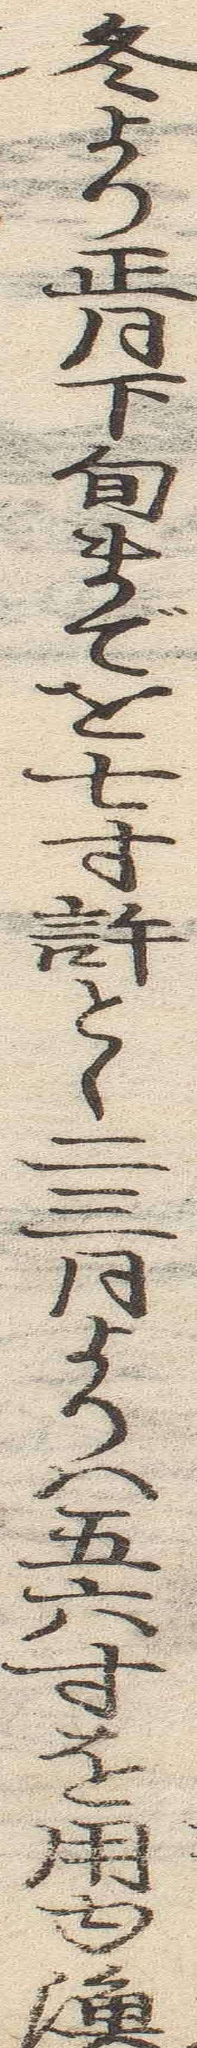冬より正月下旬までを七寸許とし二三月よりは五六寸を用ゆ漁
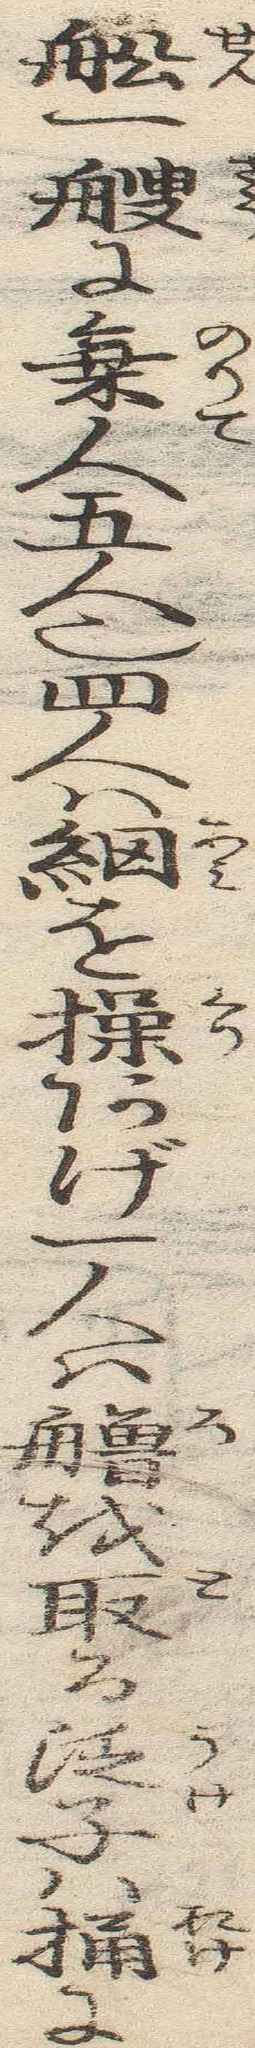船一艘に乗人五人也四人は網を操あげ一人は艪を取る泛子は桶に
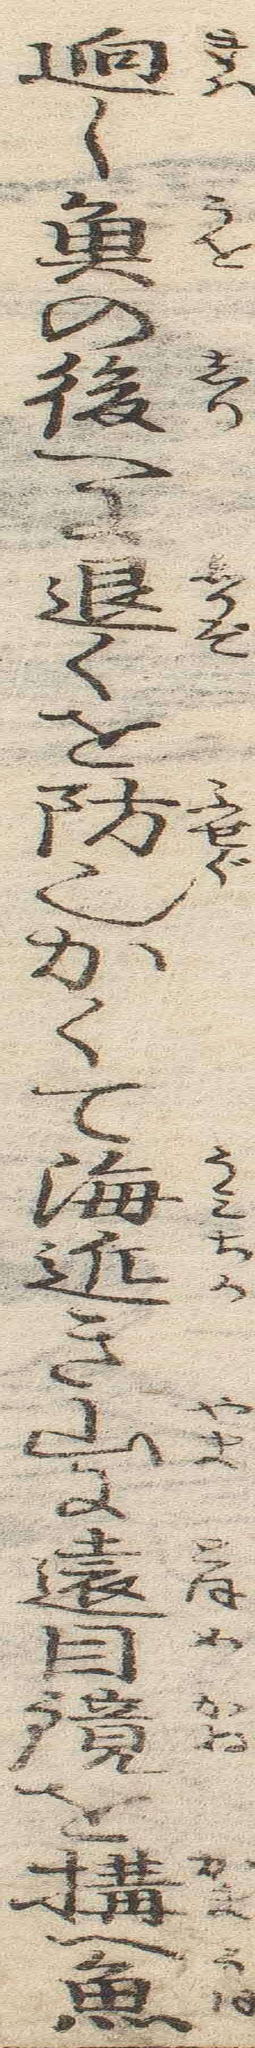廻し魚の後へに退くを防也かくて海近き山に遠眼鏡を搆へ魚
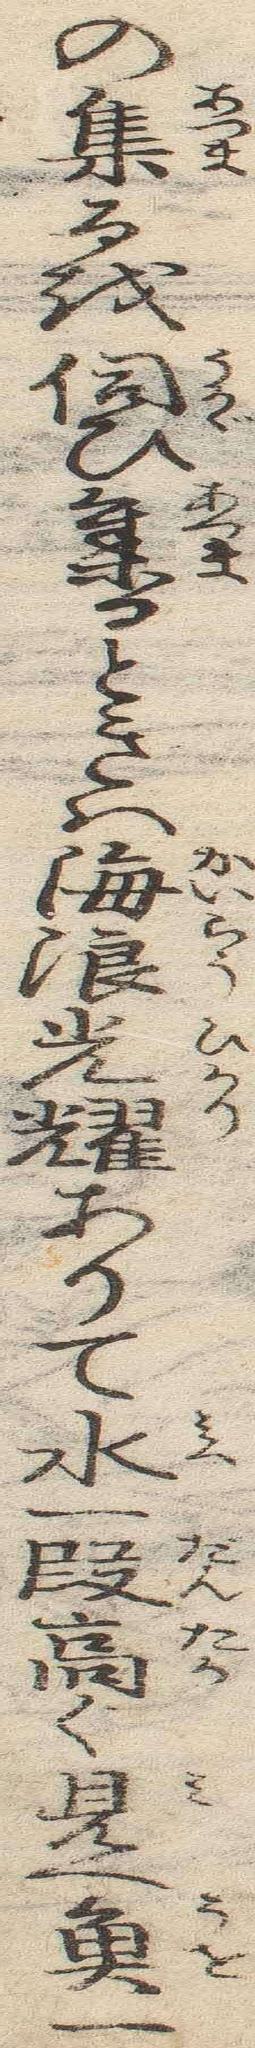の集るを伺ひ集るときは海浪光耀ありて水一段高く見へ魚一
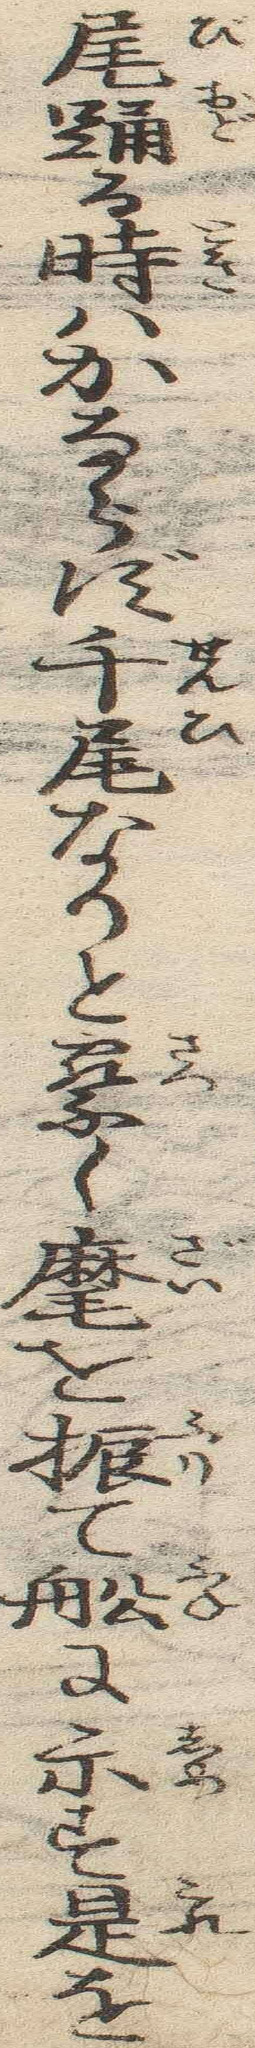尾踊る時はかならず千尾なりと察し麾を振て船に示す是を
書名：日本山海名産図会
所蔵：東京学芸大学附属図書館 国文学研究資料館
